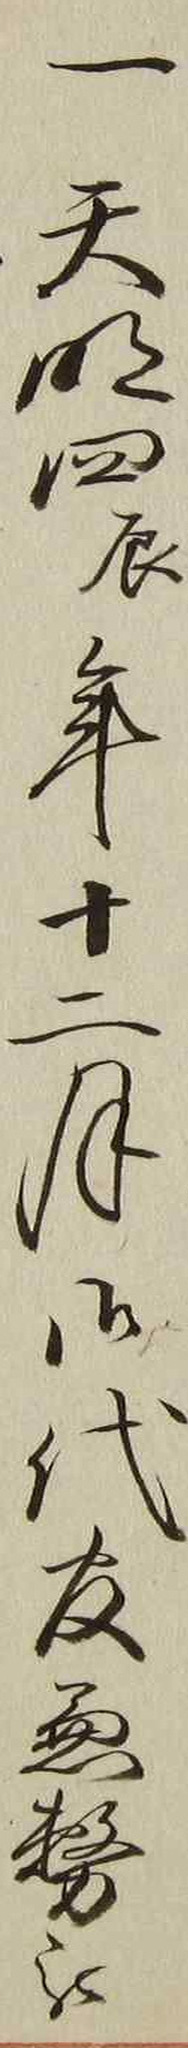一天明四辰年十二月御代官兼務被
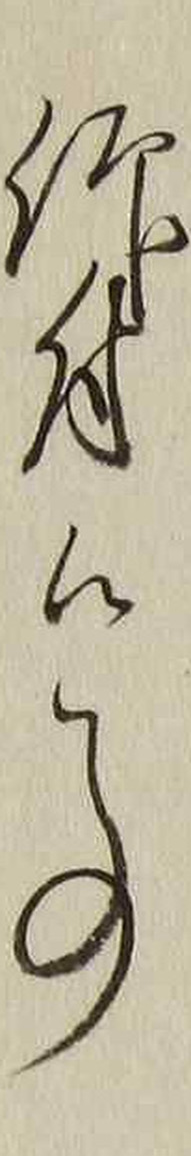仰付候事
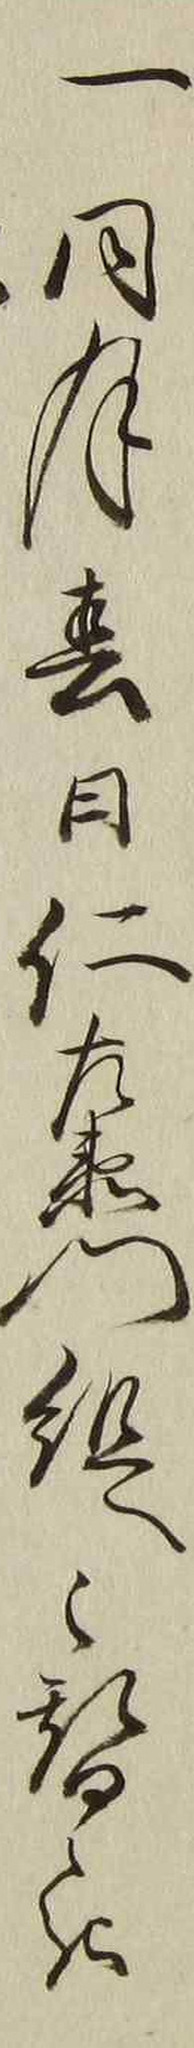一同月春日仁左衛門組へ之替被
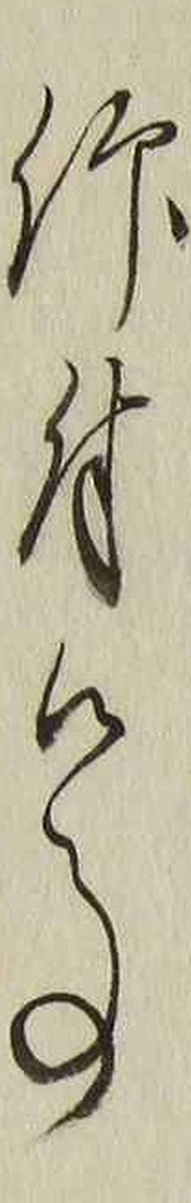仰付候事
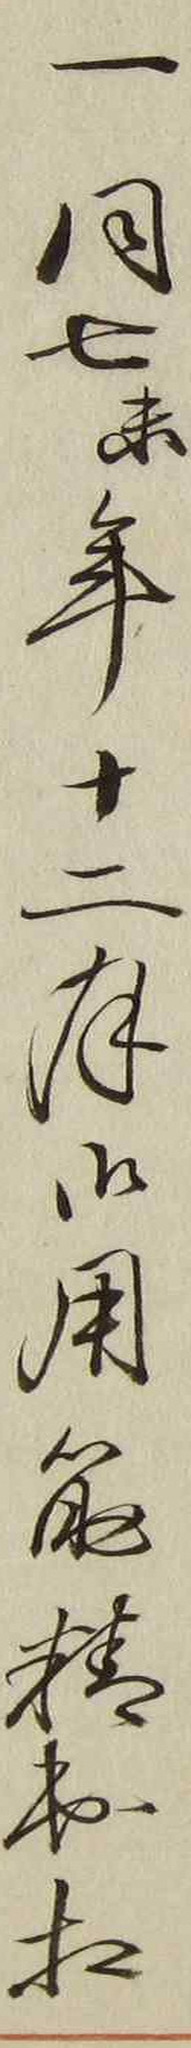一同七未年十二月御用精出相
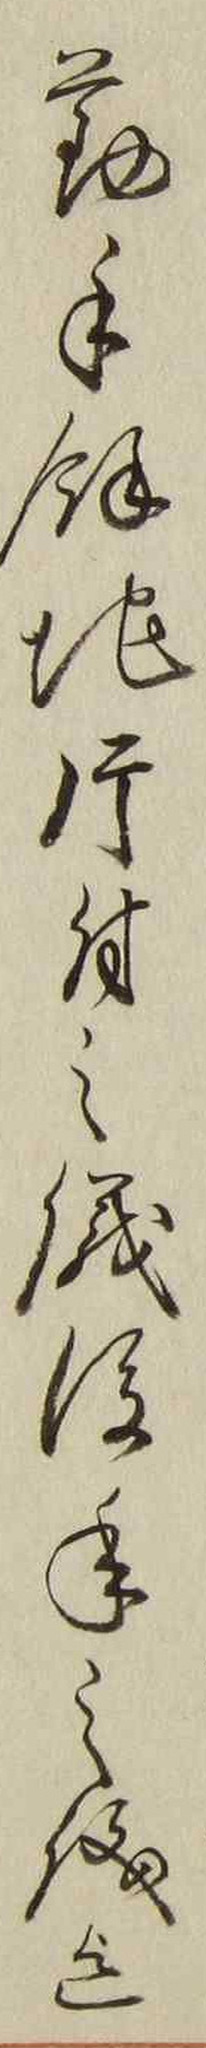勤手余地片付之儀後年之儀迄

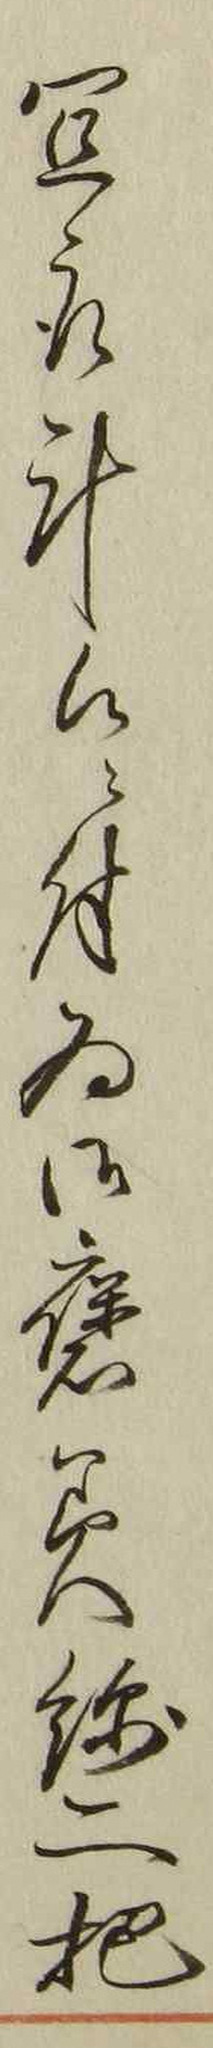宜取計候ニ付為御褒美綿二把
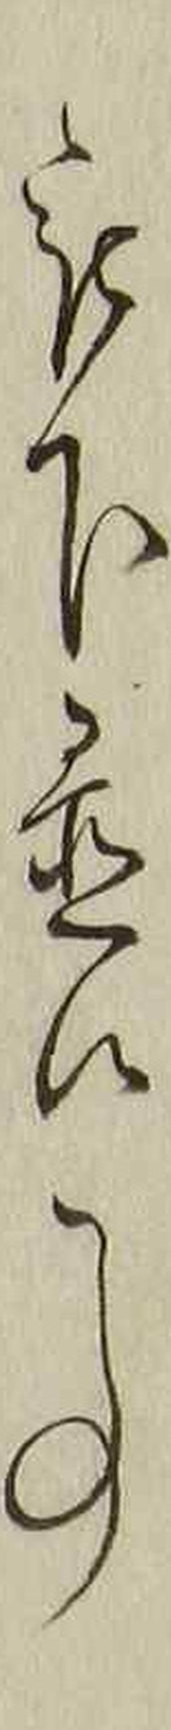被下置候事
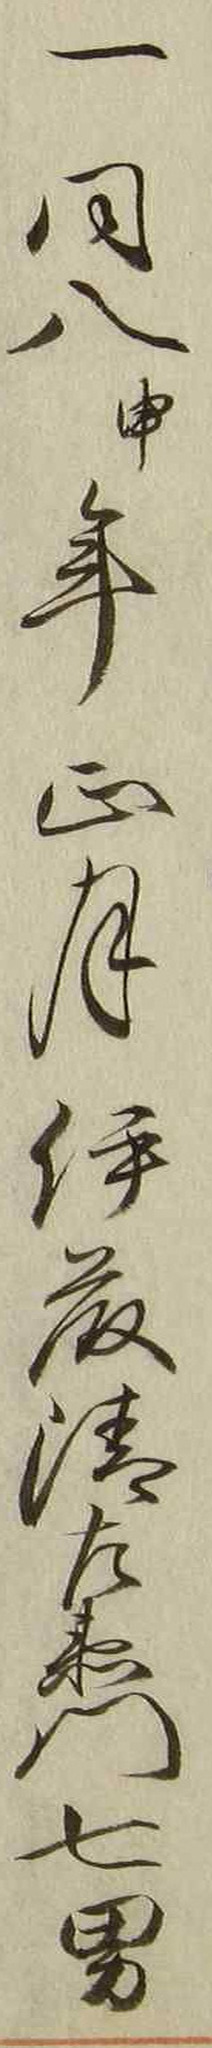一同八申年正月伊藤清左衛門七男
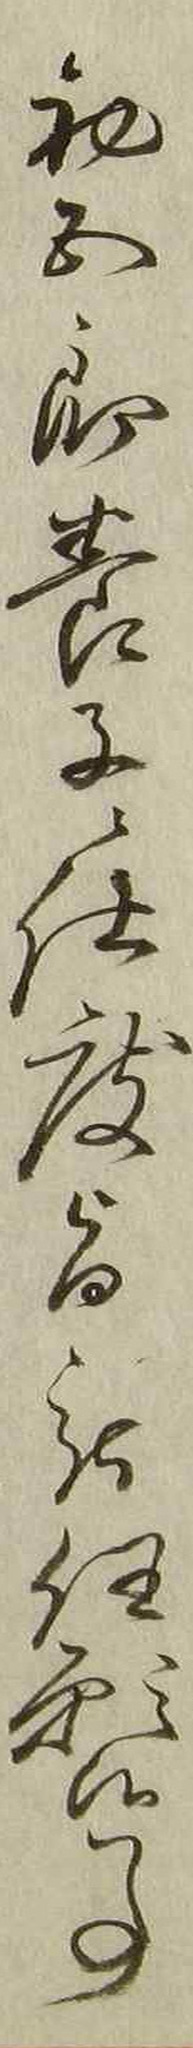初五郎養子ニ仕度旨被任願候事
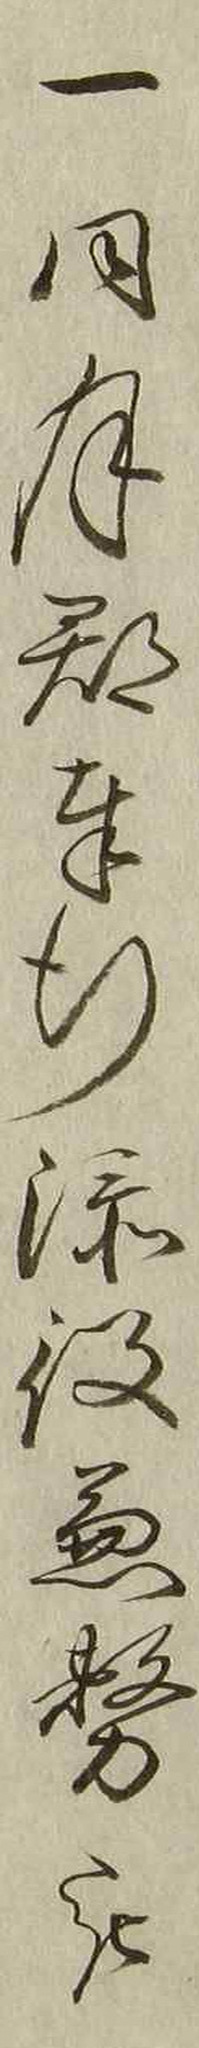一同月郡奉行添役兼務被
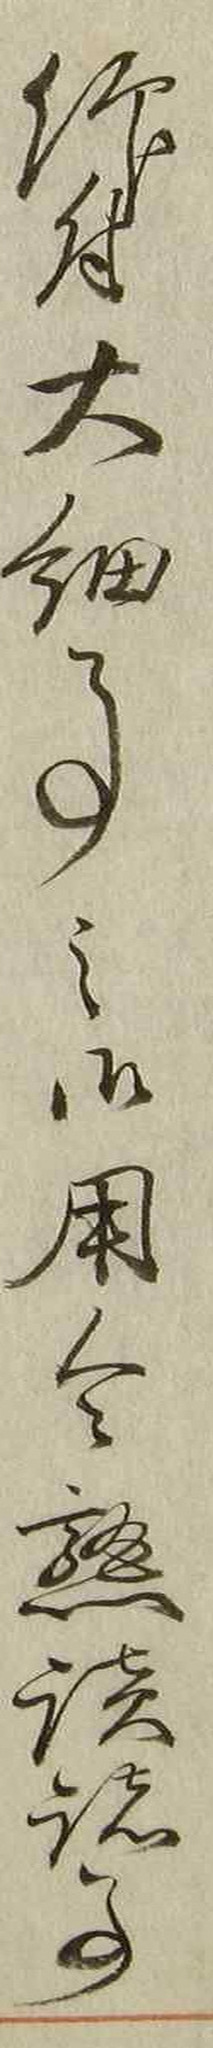仰付大細事之御用令熟談諸事
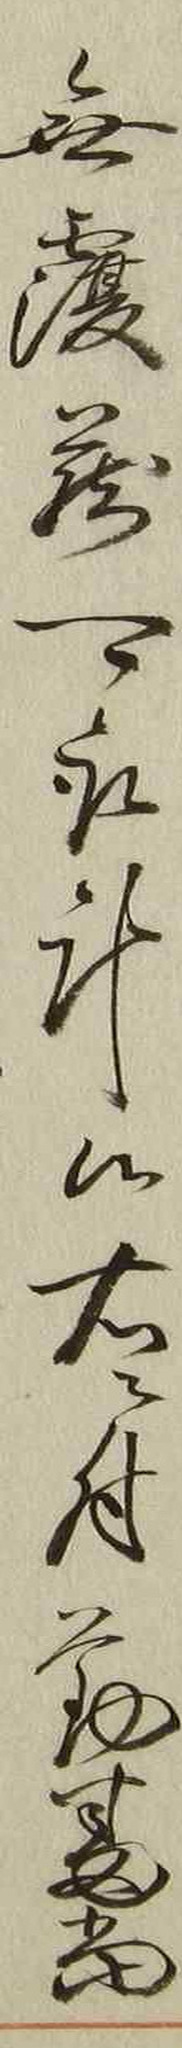無覆蔵可取計候右ニ付勤番当
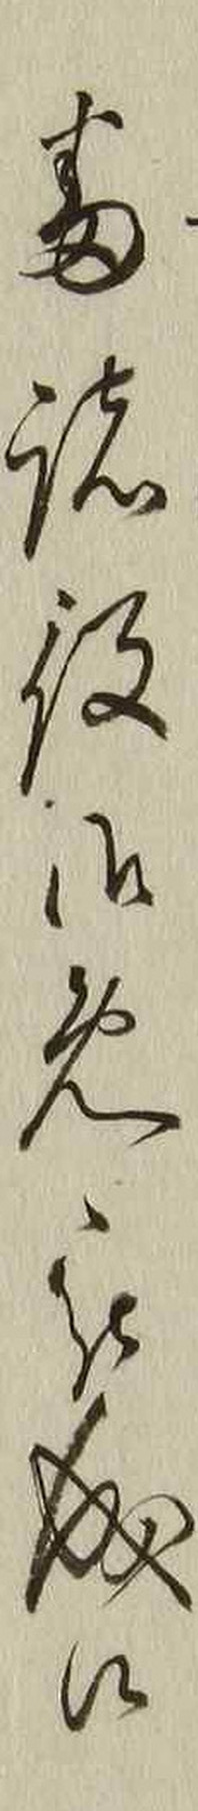番諸役御免被成候
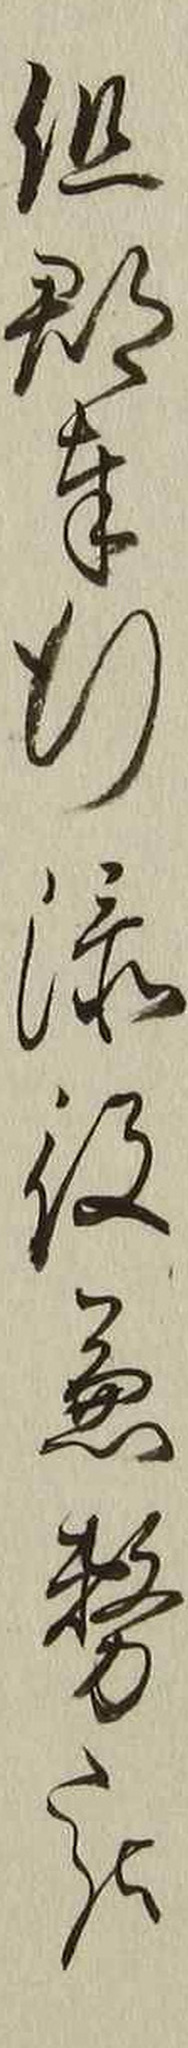但郡奉行添役兼務被
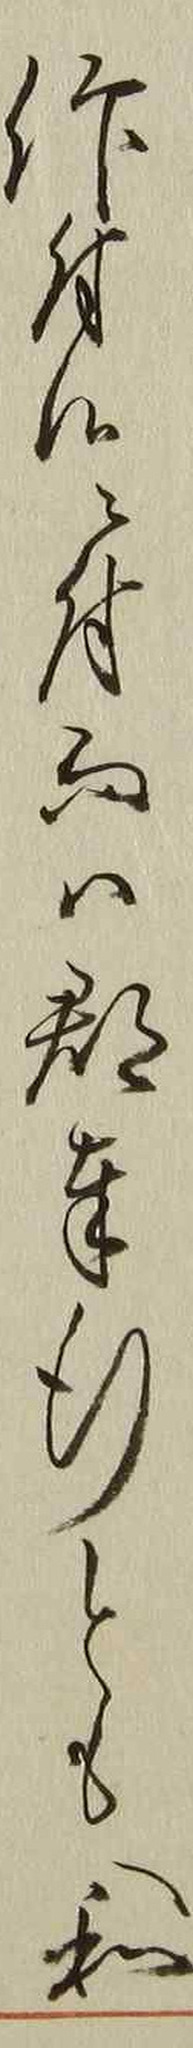仰付候ニ付而ハ郡奉行ともへ和
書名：諸士系譜　巻之54　ほ之部1
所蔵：会津若松市立会津図書館
